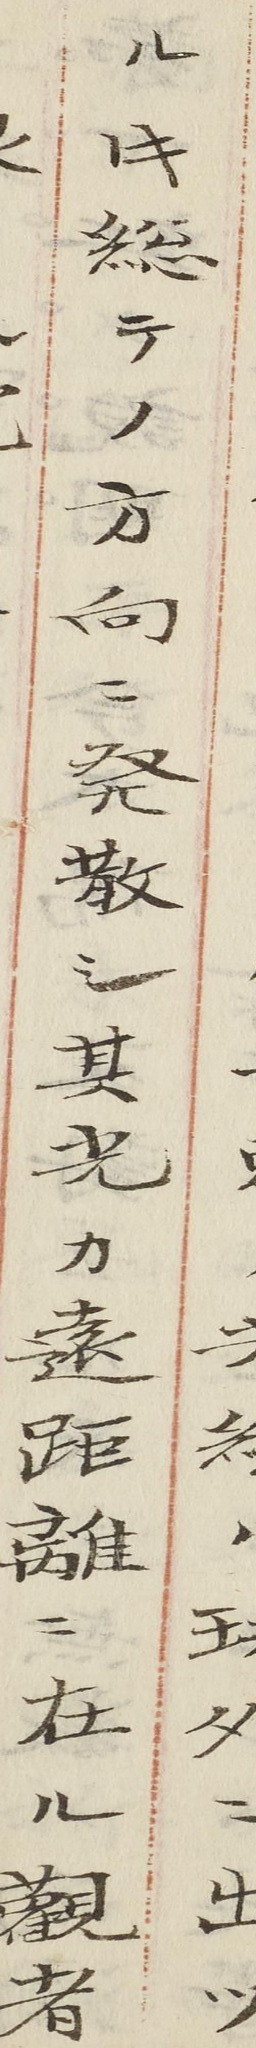ルトキ総テノ方向ニ発散シ其光カ遠距離ニ在ル観者
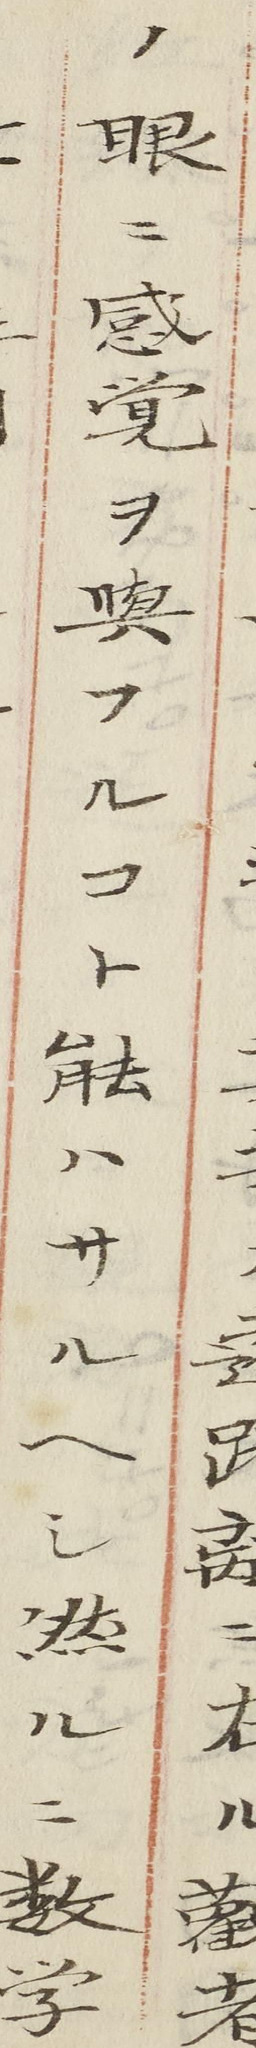ノ眼ニ感覚ヲ与フルコト能ハサルヘシ然ルニ数学
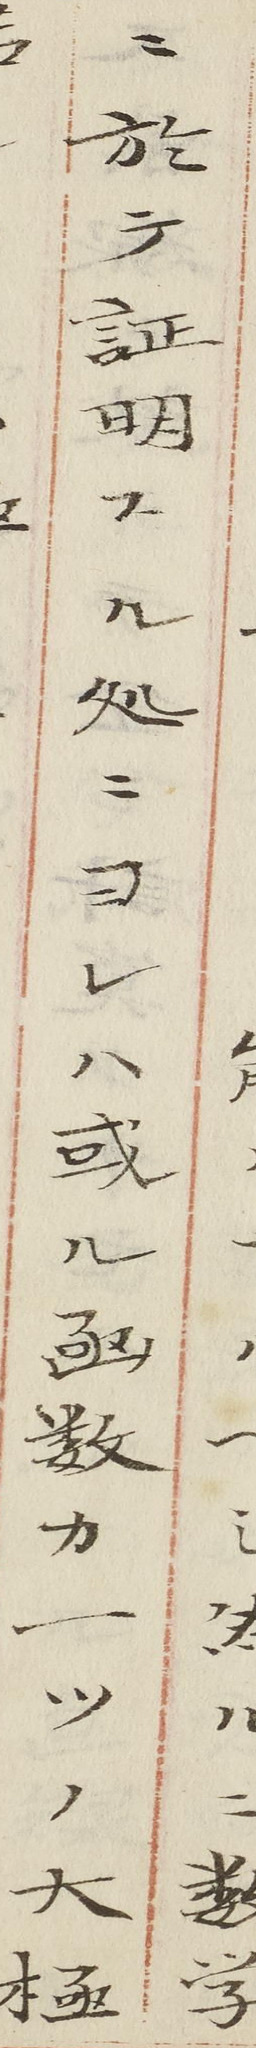ニ於テ証明スル処ニヨレハ或ル凾数カ一ツノ大極
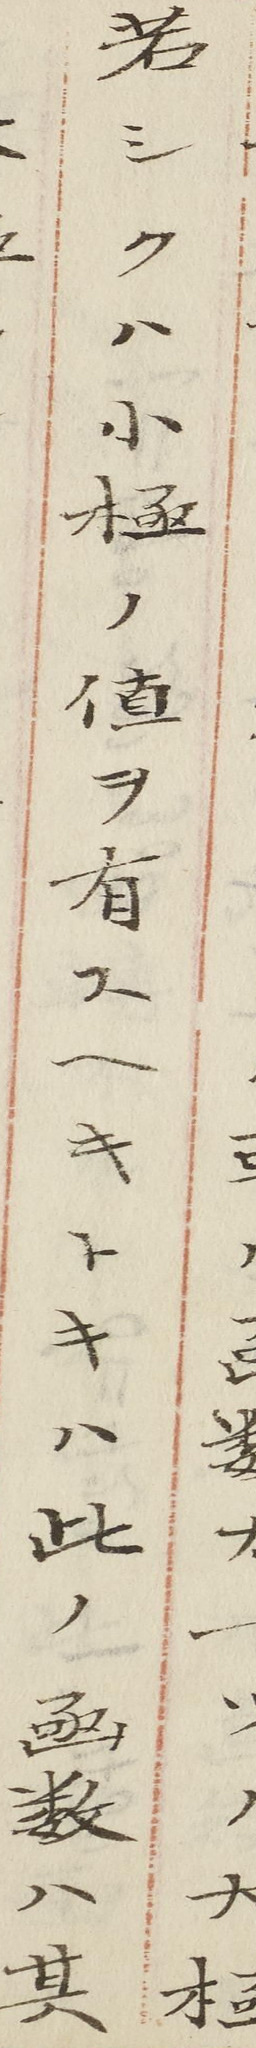若シクハ小極ノ値ヲ有スヘキトキハ此ノ凾数ハ其
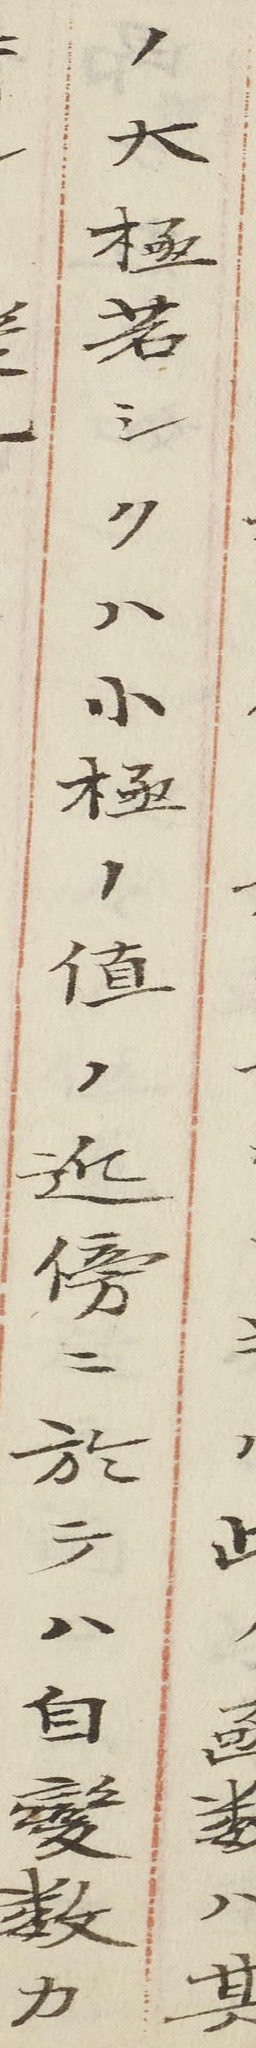ノ大極若シクハ小極ノ値ノ近傍ニ於テハ自変数カ
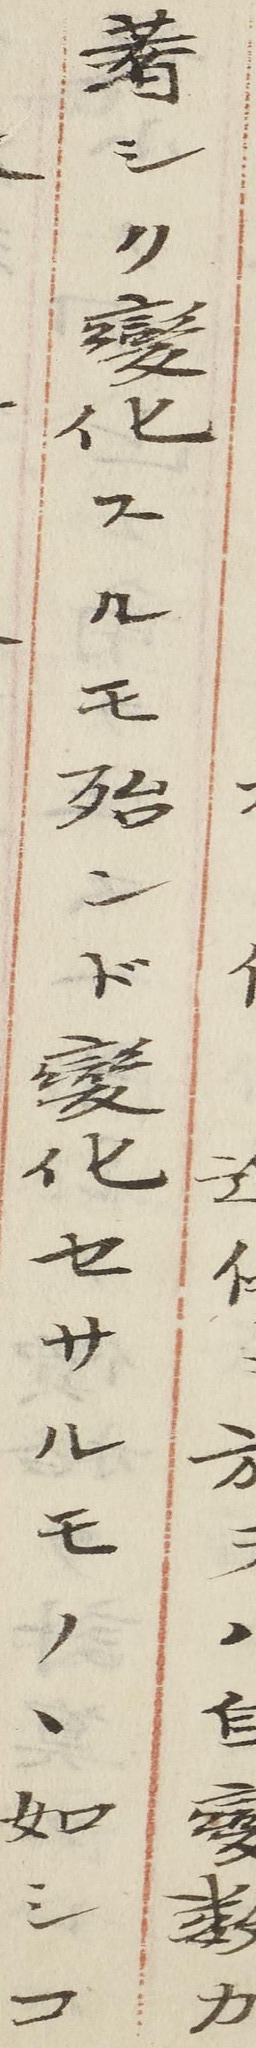著シク変化スルモ殆ンド変化セサルモノヽ如シコ
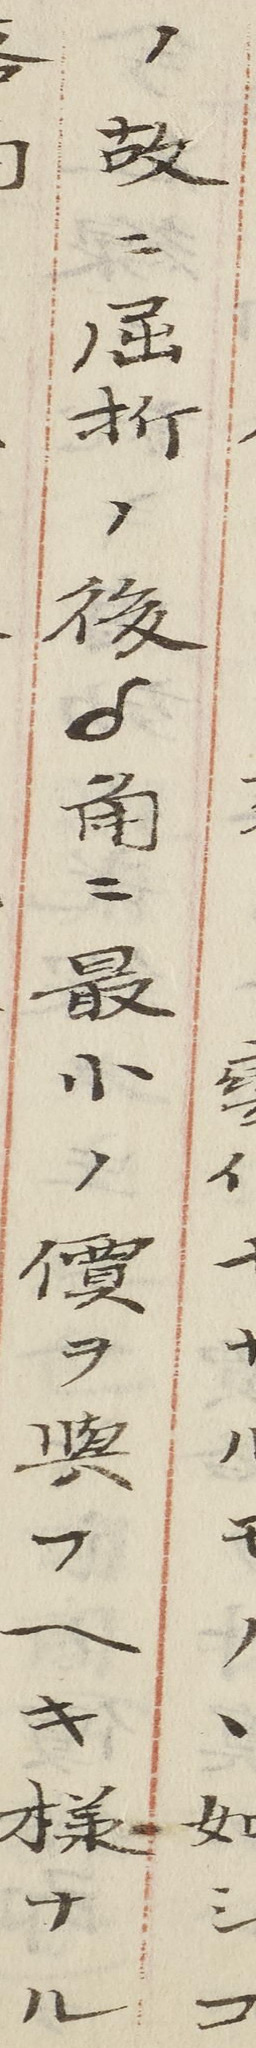ノ故ニ屈折ノ後ｄ角ニ最小ノ価ヲ与フヘキ様ナル
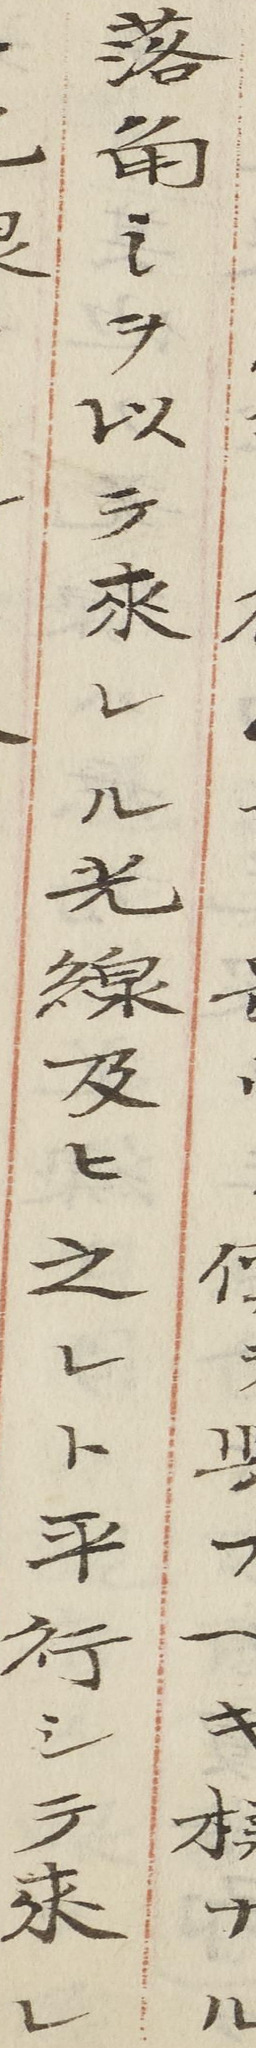落角ｉヲ以テ来レル光線及ヒ之レト平行シテ来レ
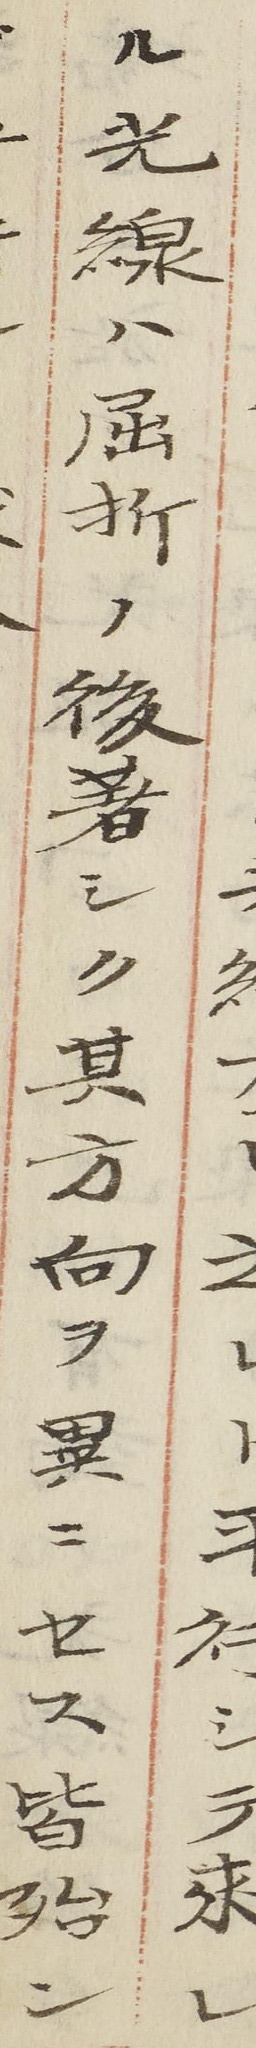ル光線ハ屈折ノ後著シク其方向ヲ異ニセス皆殆ン
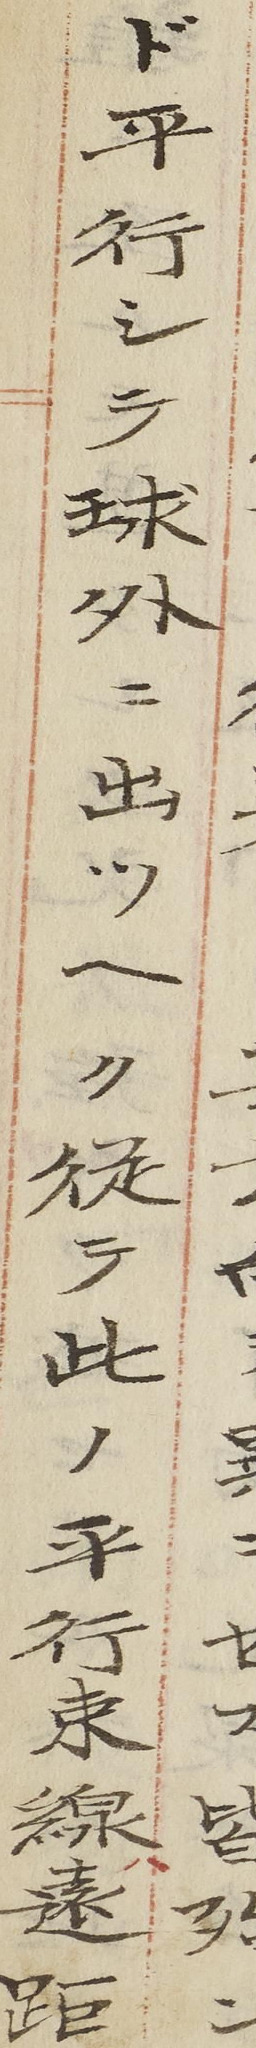ド平行シテ球外ニ出ツヘク従テ此ノ平行線ハ遠距

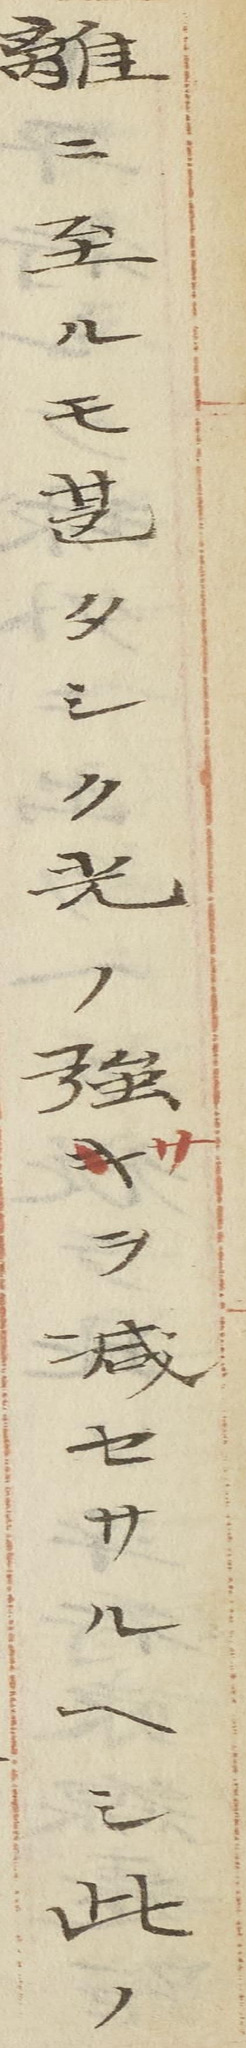離ニ至ルモ甚タシク光ノ強サヲ減セサルヘシ此ノ
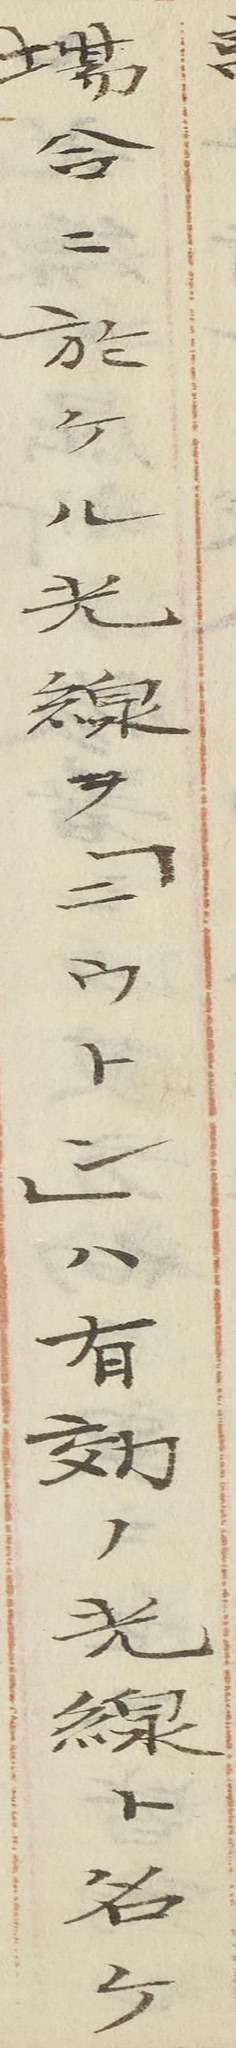場合ニ於ケル光線ヲ「ニウトン」ハ有効ノ光線ト名ケ
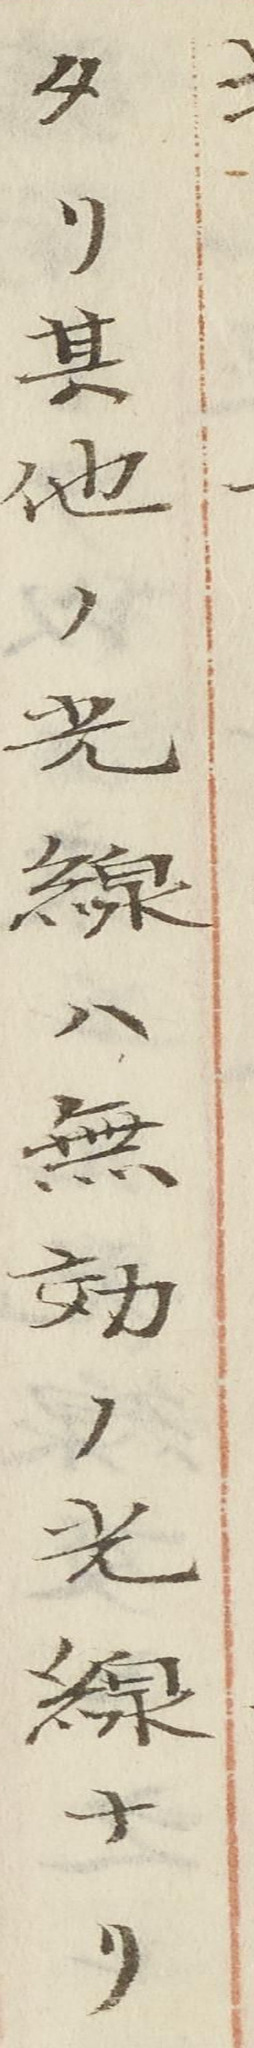タリ其他ノ光線ハ無効ノ光線ナリ
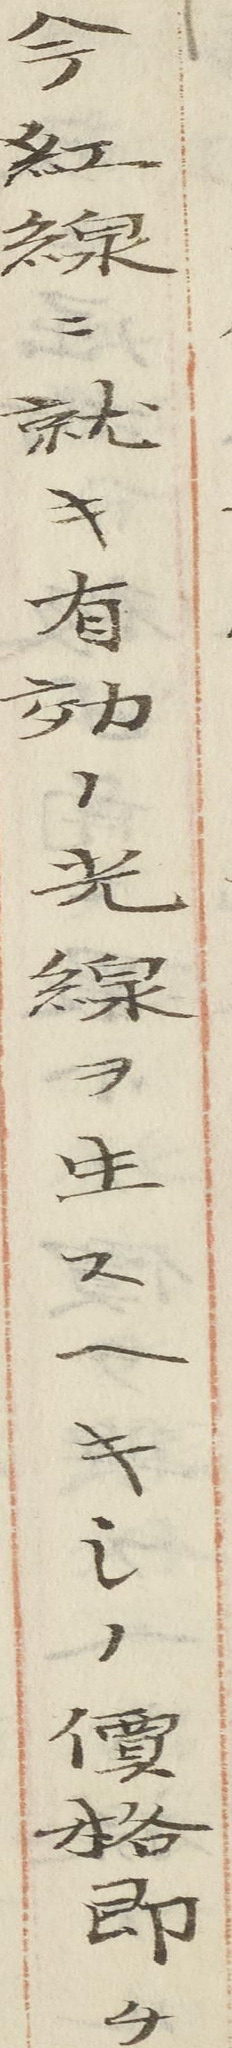今紅線ニ就キ有効ノ光線ヲ生スヘキｉノ価格即チ
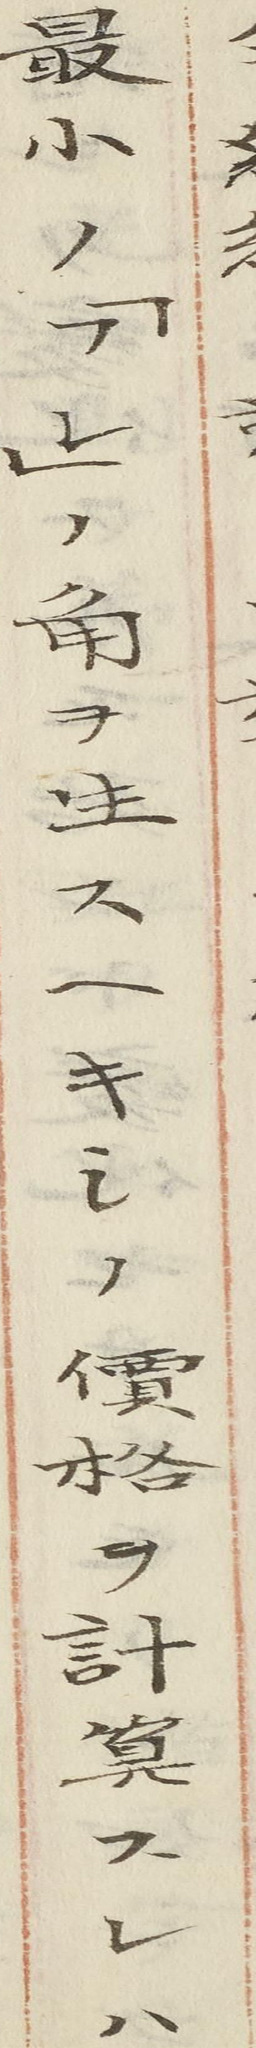最小ノ「フレ」ノ角ヲ生スヘキｉノ価格ヲ計算スレハ
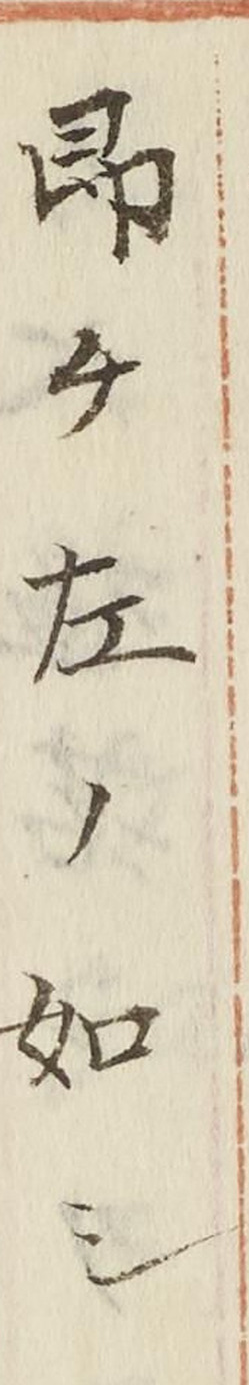即チ左ノ如シ
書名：虹及ハロノ説明
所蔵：東京大学地震研究所図書室 Earthquake Research Institute Library, The University of Tokyo, JAPAN
